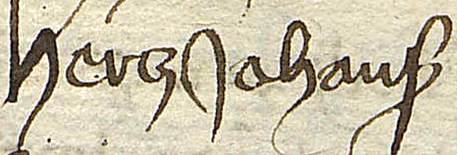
Hercʒ* Iohanſ*
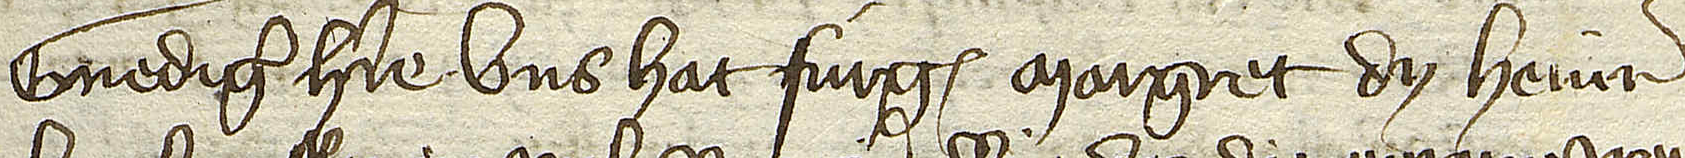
Gnedig* h*re Vns hat fürg* Margret dy heinr*
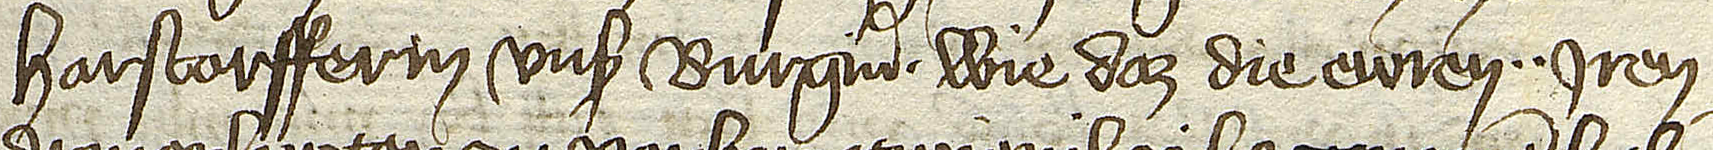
harſtorfferin vnſ* Burgin* . wie daʒ die ewren ~ Iren
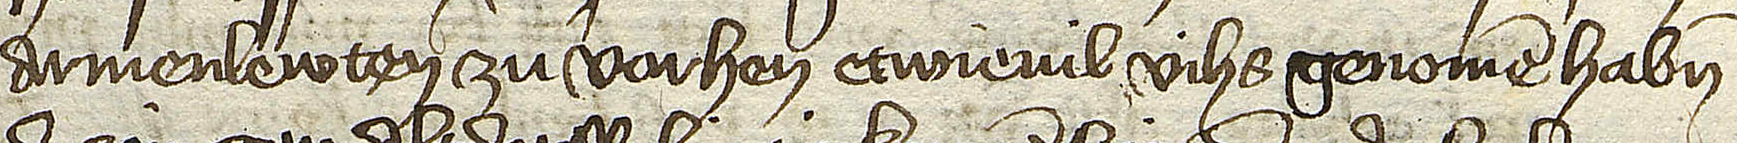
Armenlewten cʒu vorhen etwieuil vihs genome* habn*
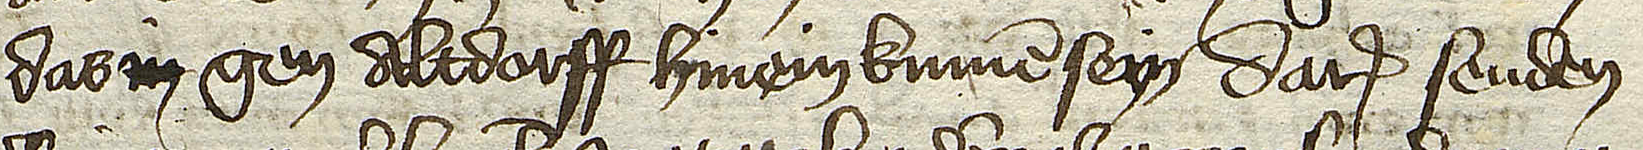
das in gen Altdorff hinein kume* ſey Dar* ſenden
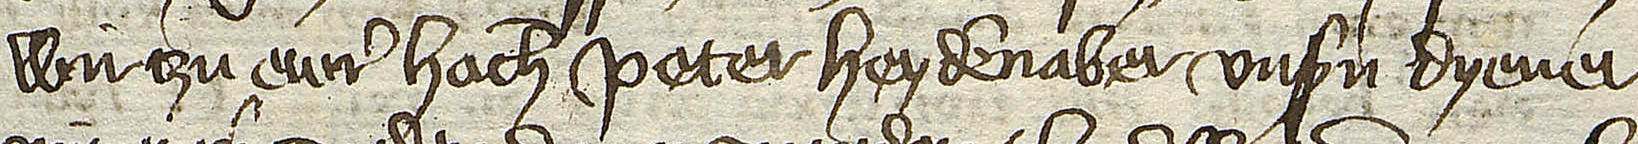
wir cʒu ewr* hoch* Peter heyde*naber vnſ*n dyener
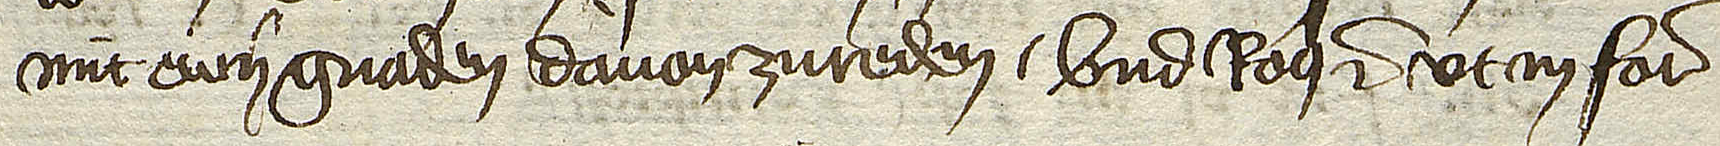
mit ewn* gnaden dauon cʒureden / Vnd Ro* ec* vt in for*
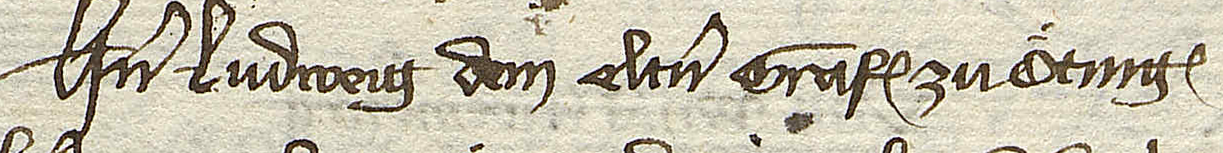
Hn* Ludweig dem eltn* Graf* cʒu Öting*
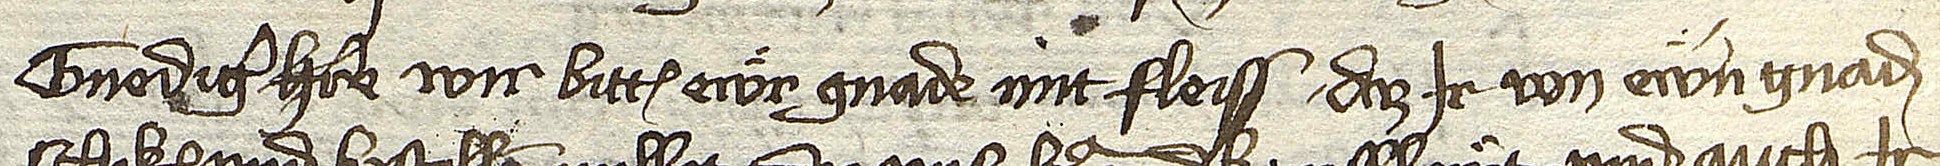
Gnedig* hr*e wir bitt* eẅr gnade mit fleiſſ / daʒ Ir von eẅn* gnad*
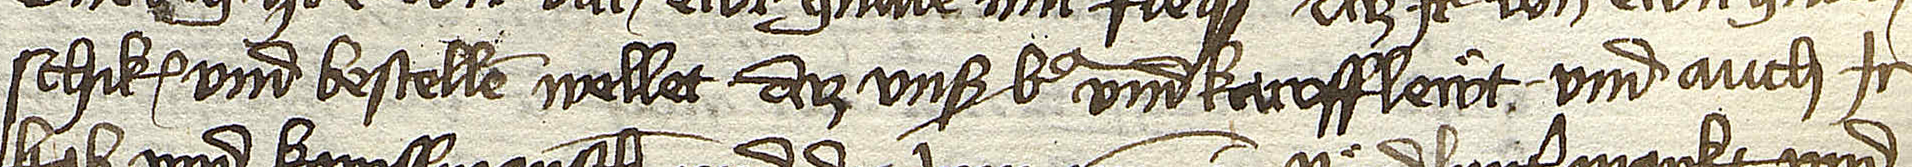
ſchik* vnd beſtelle* wellet daʒ vnſ* b* vnd kawffleẅt . vnd auch Ir
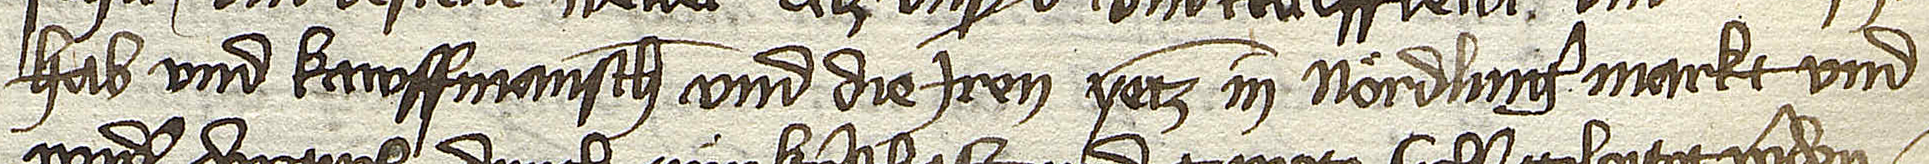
hab vnd kawffmanſch* vnd die Iren yecʒ* in Nördling* markt vnd
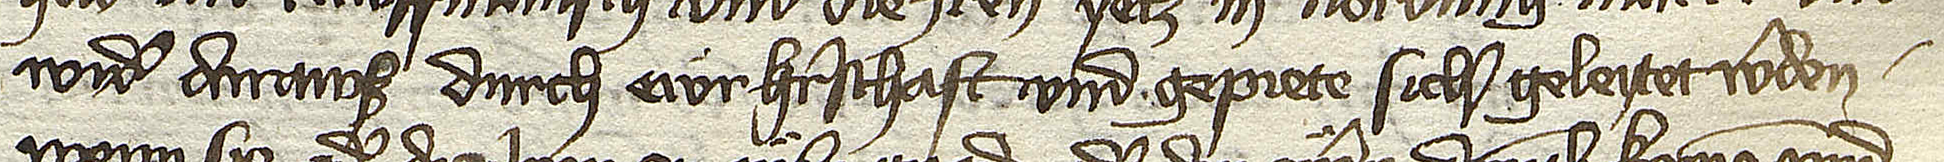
wid* darauſʒ durch eẅr hr*ſchaft vnd gepiete ſich* geleytet w*den
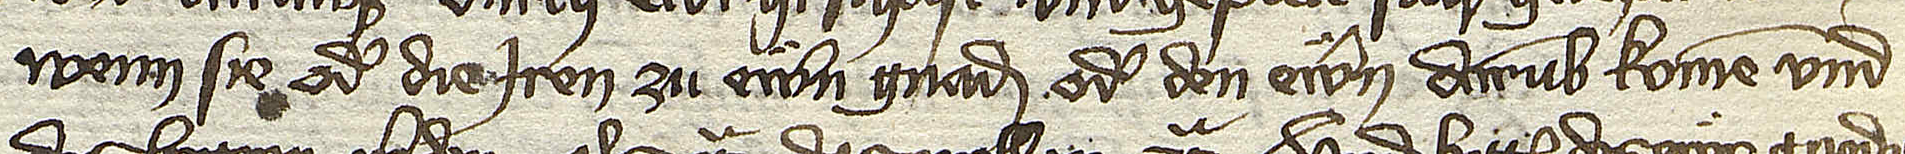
wenn ſie od* die Iren ʒu eẅ*n gnad* od* den eẅ*n darub* kome* vnd
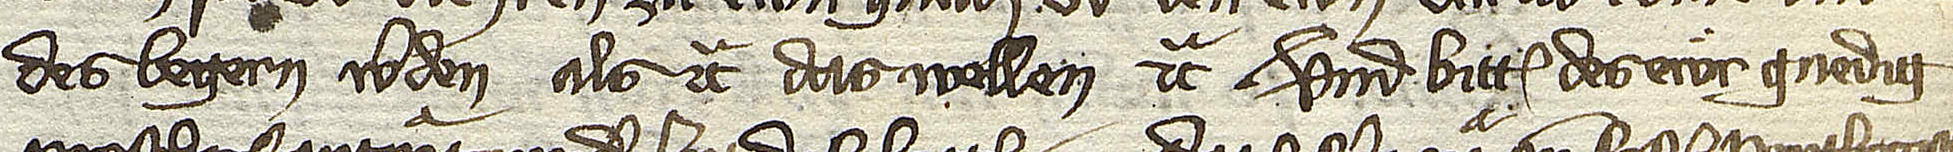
des begern w*den als ec* das wellen ec* / Vnd bitt* des eẅr gnedig
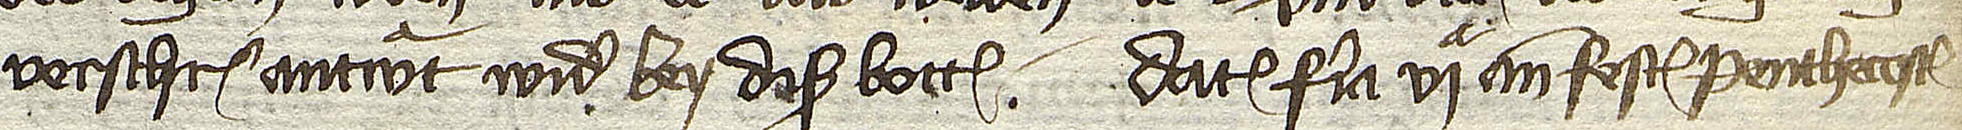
verſchr* antwt* wid* bey diſ* bott* / Dat* fia vi* an* feſt* Penthecoſt*
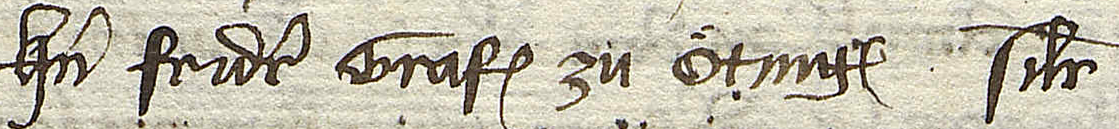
hn* fridr* Graf* ʒu Öting* ſilr*
